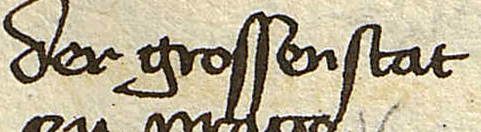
der groſſen ſtat
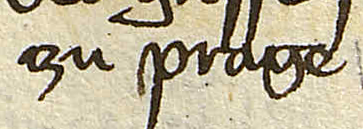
cʒu Prage
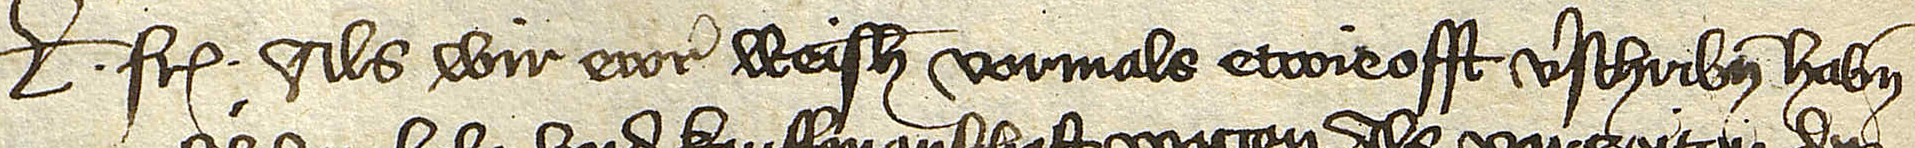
L* . fr* . Als wir ewr* weiſh* vormals etwieofft v*ſchribn* habn*
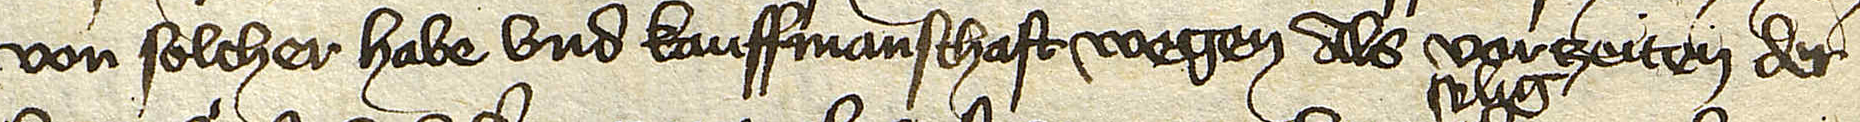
von ſölcher habe vnd kauffmanſchaft wegen Als vorcʒeiten der
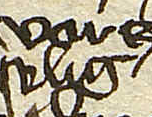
ſelig
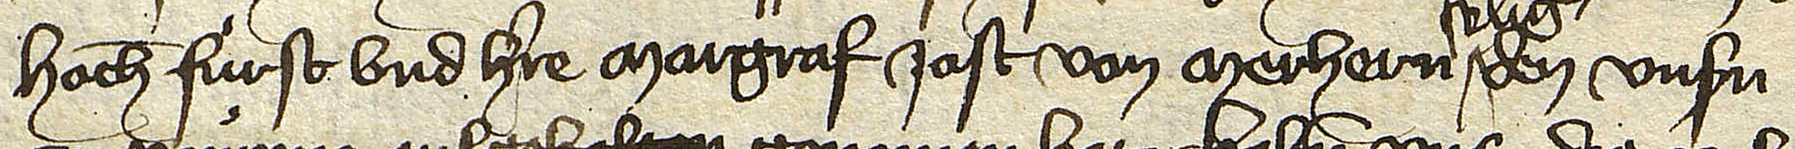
hoch* fürſt vnd h*re Margraf Ioſt von Merhern den vnſ*n
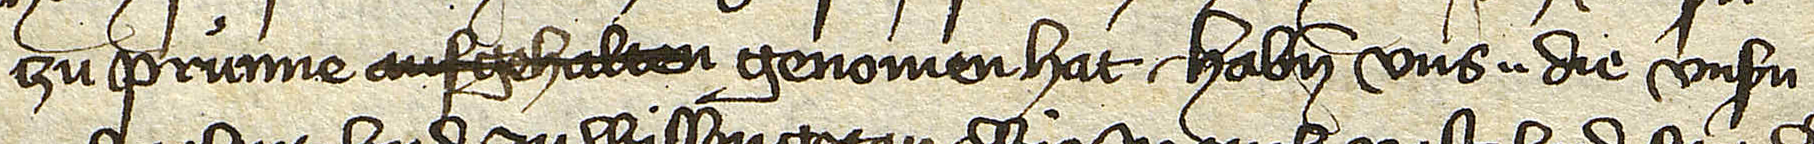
cʒu Prünne aufgehalten genomen hat / habn* vns ~ die vnſ*n
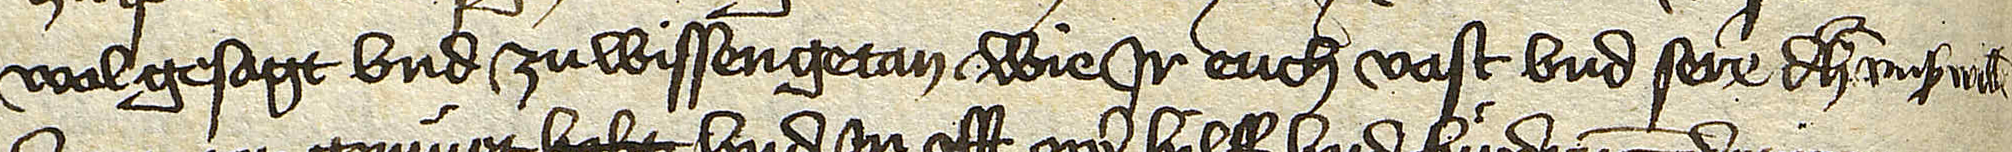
wol geſagt vnd cʒu wiſſen getan / wie Ir euch vaſt vnd ſere d*h vnſ* wille*
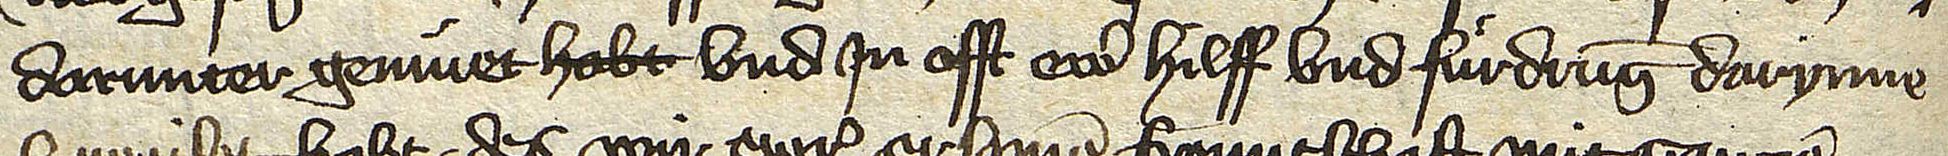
darunter gemüet habt vnd In offt ew* hilff vnd fürdrug* darynne
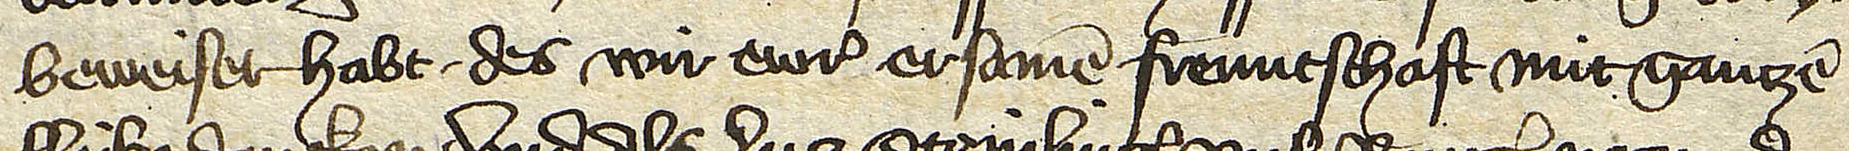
beweiſet habt / des wir ewr* erſame* freuntſchaft mit gancʒe*
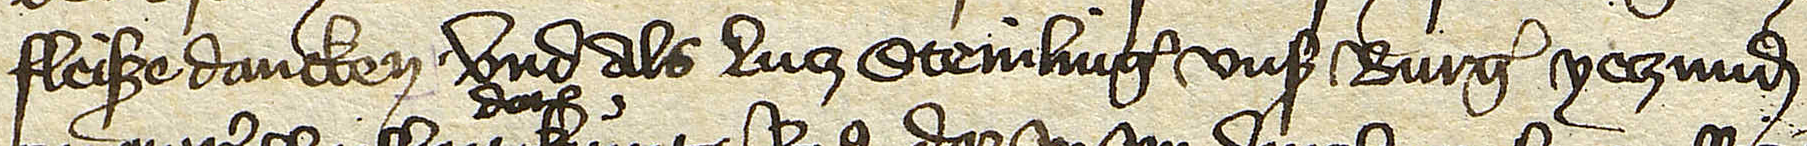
fleiſʒe dancken / Vnd als lucʒ Steinling* vnſ* Burg* yecʒund*
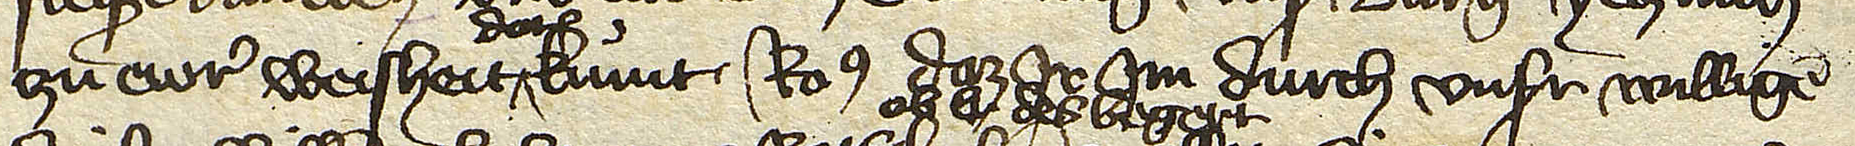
cʒu ewr* weiſheit kümt / Ro* daʒ Ir Im durch vnſ*r willige*
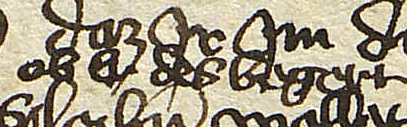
ob Er des begert
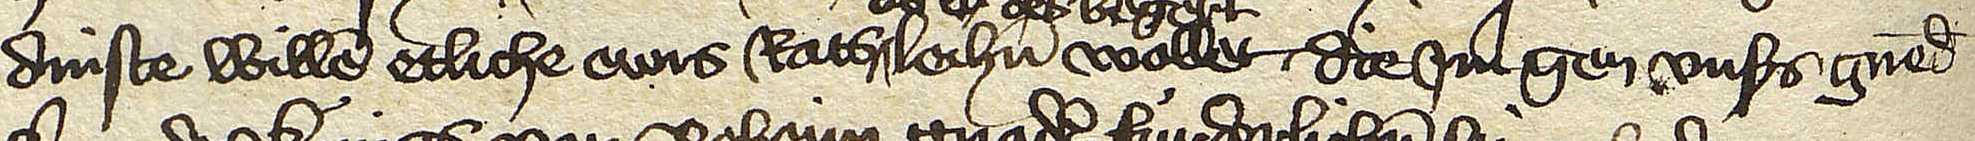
dinſte wille* etliche ewrs Rats leihn* wöllet / die Im gen vnſ*s gned*
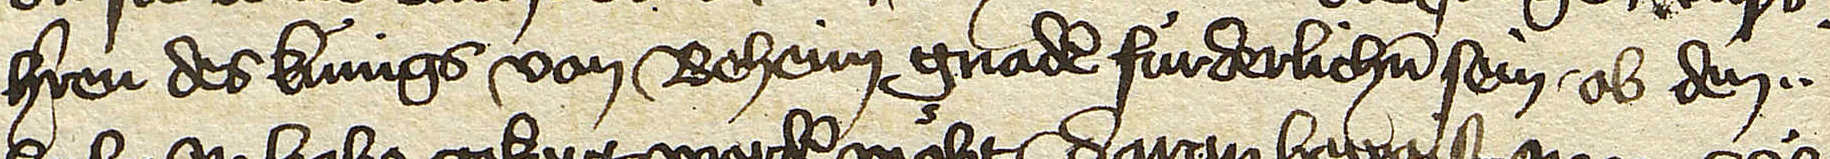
h*ren des künigs von Beheim gnade* fürderlichn* ſein / ob den ~
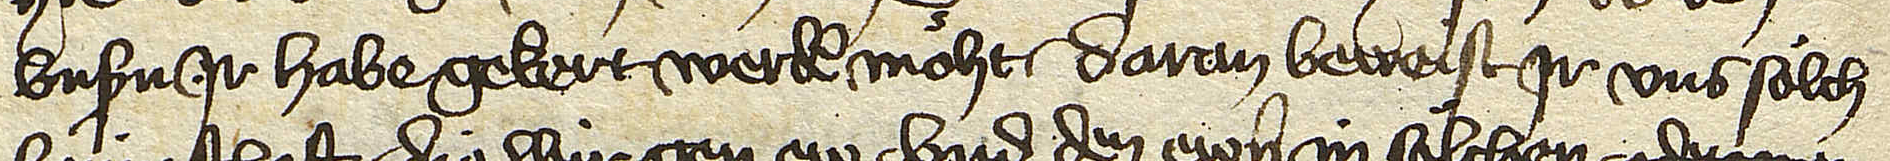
vnſ*n Ir habe gekert werde* möht / daran beweiſt Ir vns ſölch
